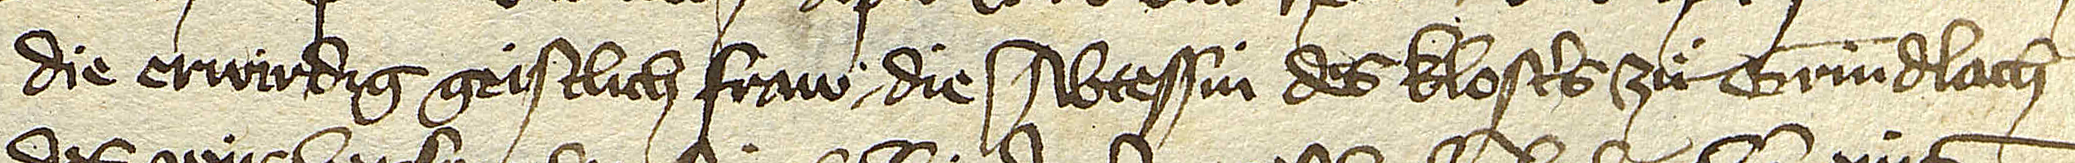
die erwirdig geiſtlich fraw / die Abteſſin des kloſt*s cʒü Grindlach
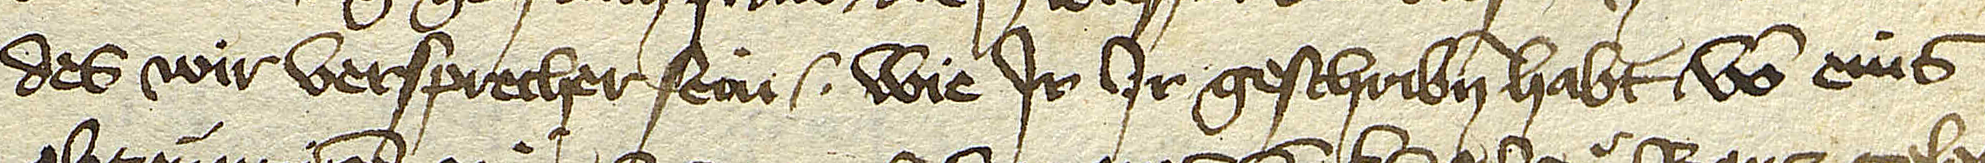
des wir verſprecher ſein / . wie Ir Ir geſchribn* habt / vo* eins
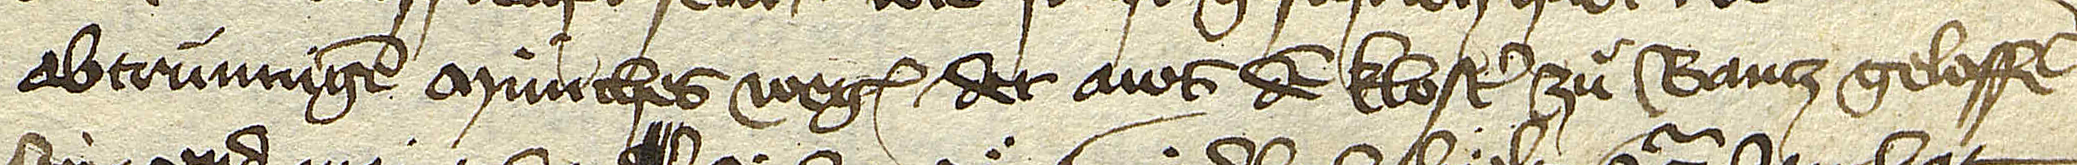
abtrünnige* Münches weg* / der aws d* kloſt* cʒü Bancʒ geloffe*
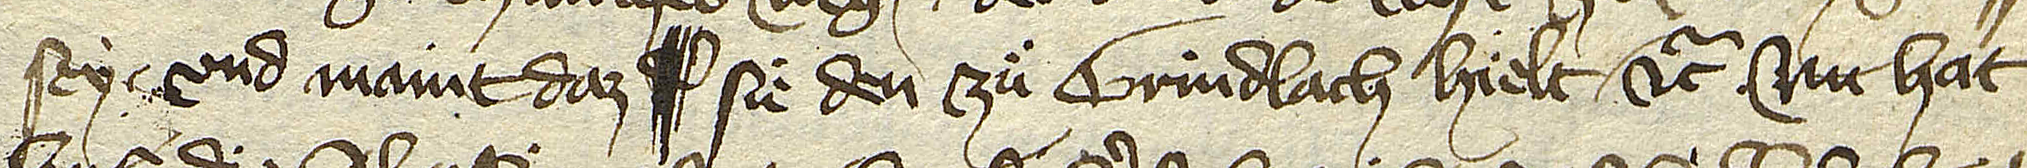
ſey / vnd maint ʒ d* ſie den cʒü Grindlach hielt / ec* . Nu hat
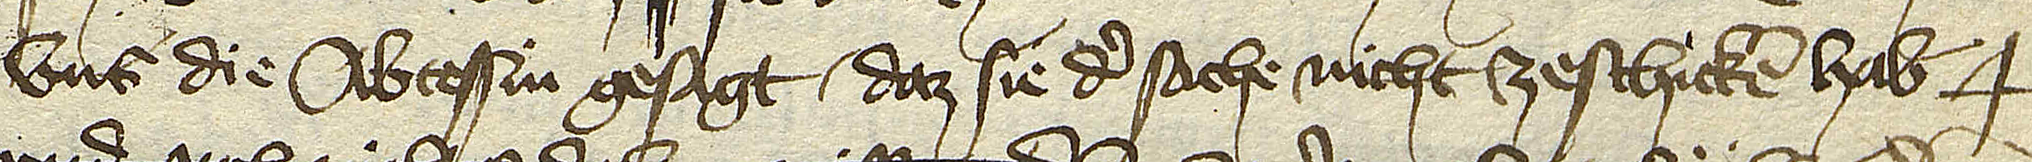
vns die Abteſſin geſagt / daʒ ſie d* ſache nicht cʒeſchicke* hab* /
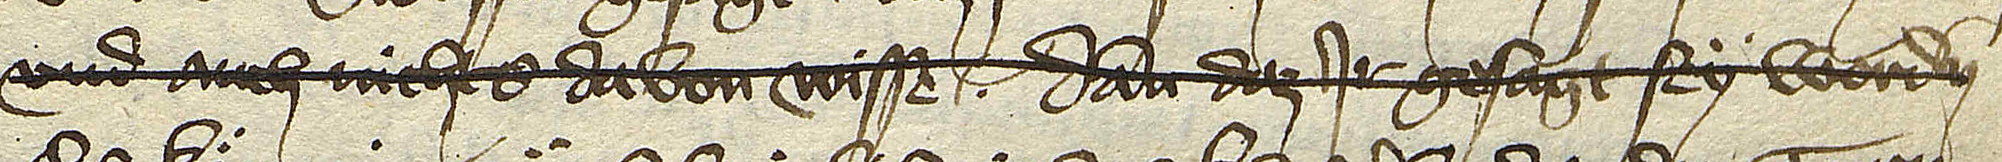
vnd auch nichts davon wiſſe / . dan* daʒ Ir geſagt ſey wordn*
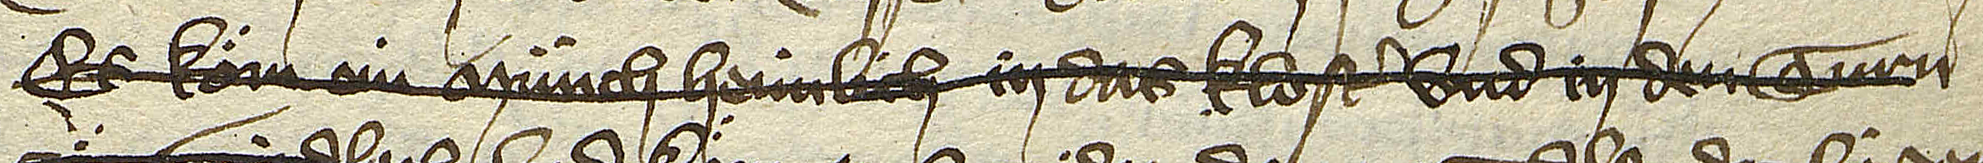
Es köm ein Münch heimlich in das kloſt* vnd in den Turn
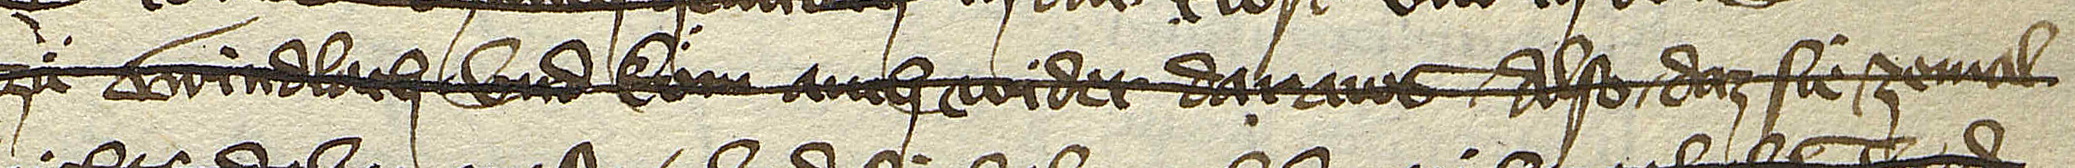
cʒü Grindlach vnd köm auch wider daraws / Alſo / daʒ ſie cʒemal
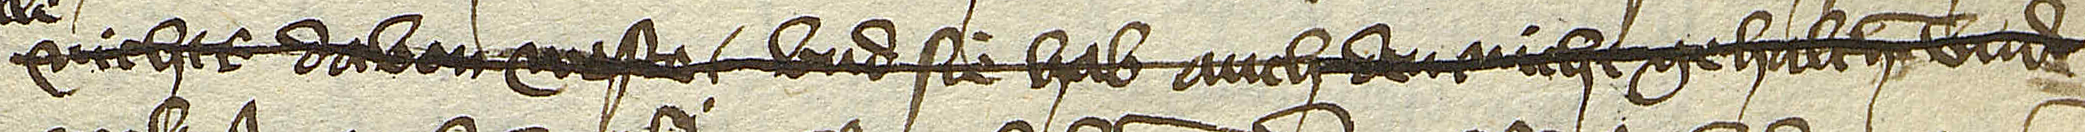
nichts davon weſte / vnd ſie hab auch den nicht gehaltn* vnd
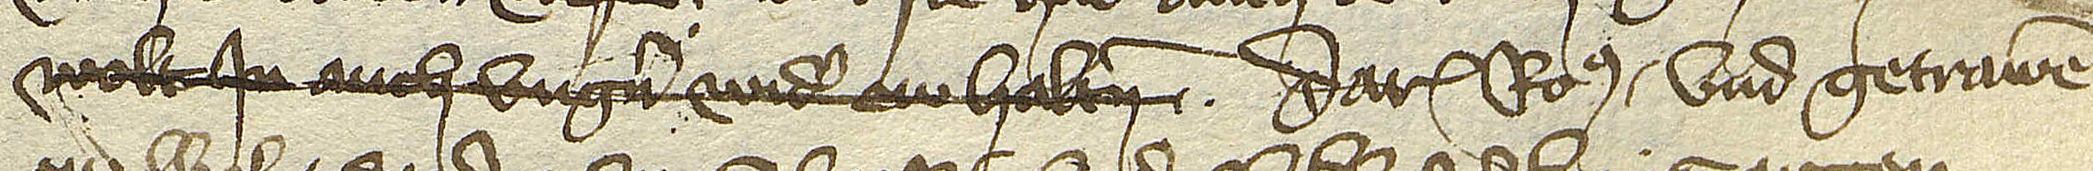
wolt In auch vngn* wid* ew haltn* / . Dar* Ro* / vnd getrawe*
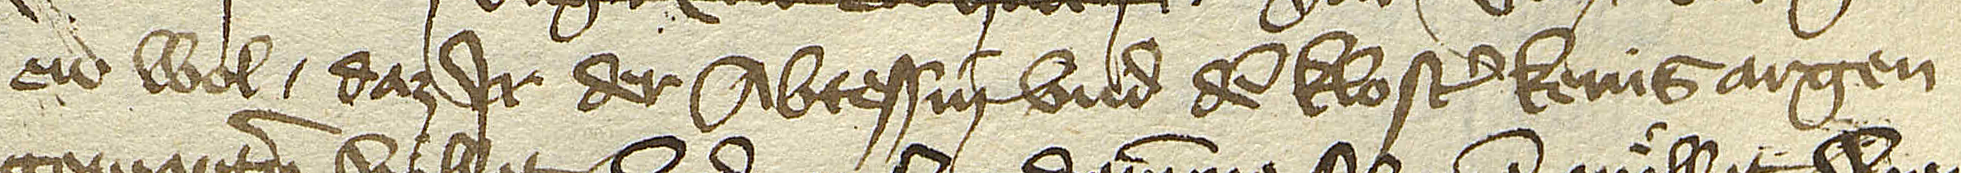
ew wol / daʒ Ir der Abteſſin vnd d* kloſt* keins argen
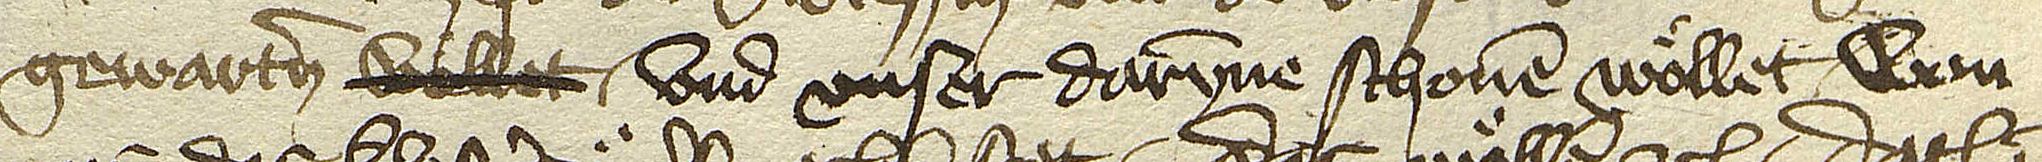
gewartn* wöllet / vnd vnſer daryne* ſchone* wöllet / wan
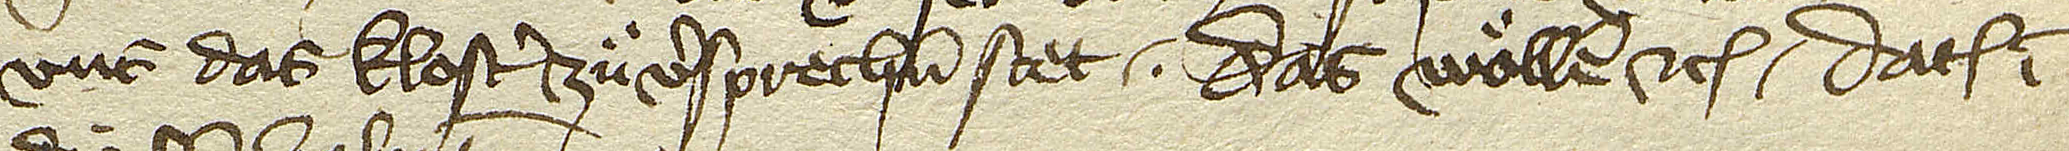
vns das kloſt* cʒü v*ſprechn* ſtet / . Das wölle ec* / Dat* i*
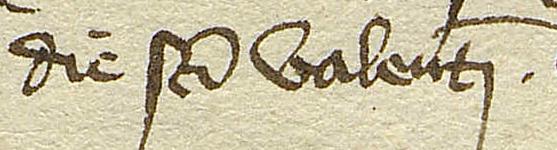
die ſci* valenti* .
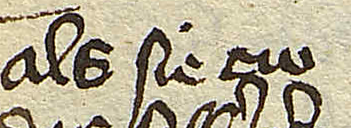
als ſie ew
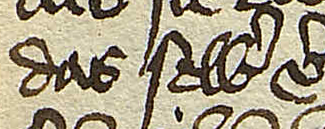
das ſelb* v*
